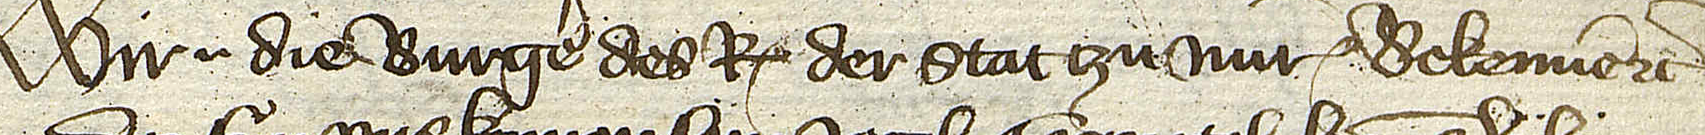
Wir ~ die Burge* des R* der Stat cʒu Nür* Bekenne* ec*
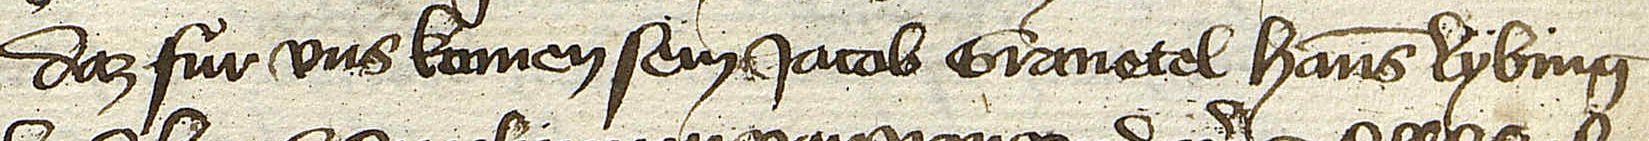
daʒ für vns komen ſein Iacob Granetel hans* lybing
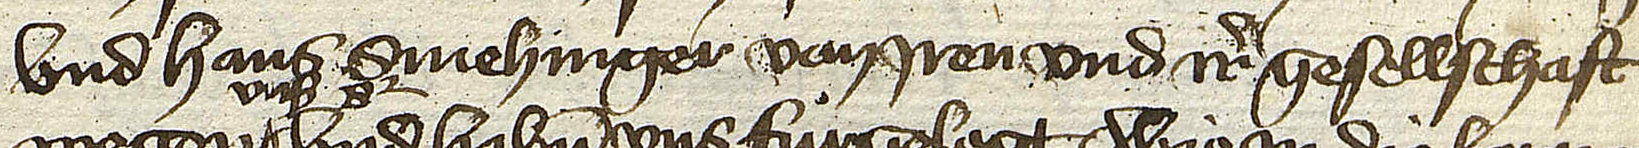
vnd hans Smehinger von Iren vnd ir* geſellſchaft
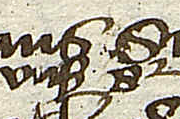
vnſ* B*
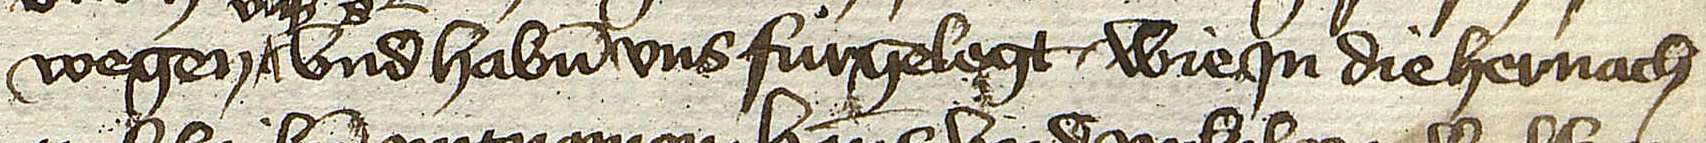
wegen vnd hab*n vns fürgelegt / Wie In die hernach
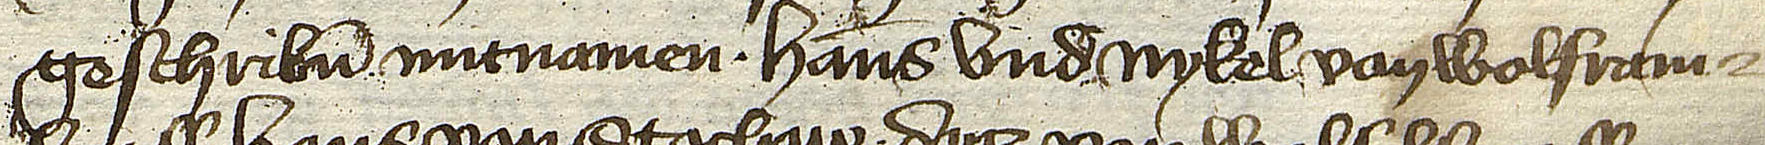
geſchrib*n mitnamen . hans* vnd Nykel von Wolfram =
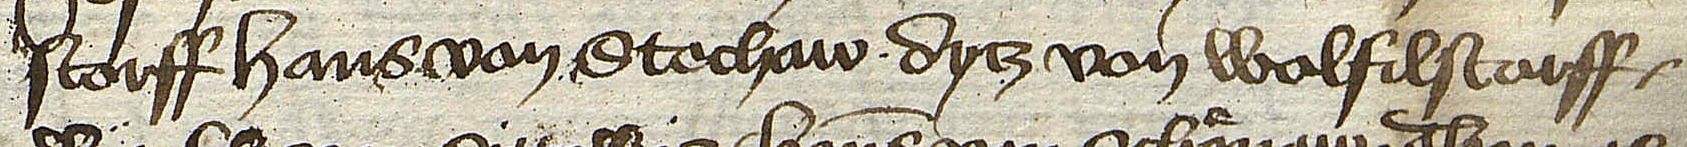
ſtorff hans von Stechaw . dycʒ von Wolfilſtorff /
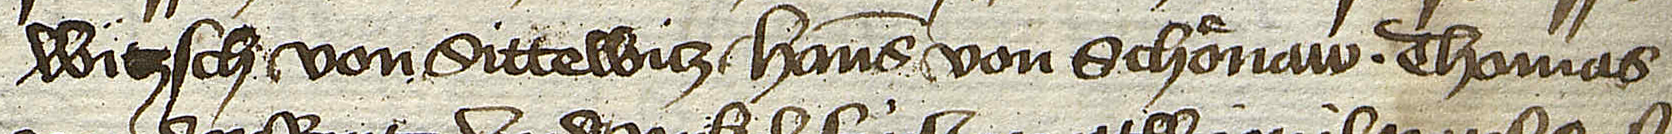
wicʒſch von Sittelwicʒ / hans* von Schönaw . Thomas
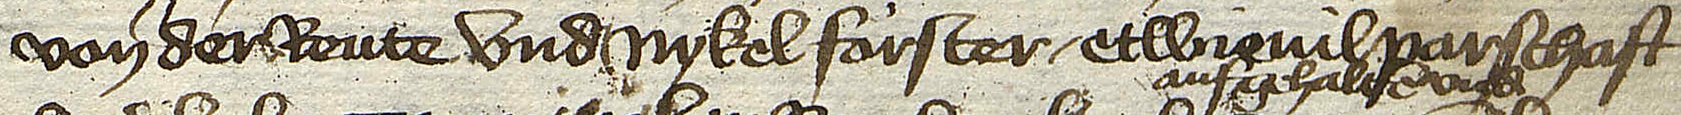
von der Reute Vnd Nykel förſter / etwieuil parſchaft
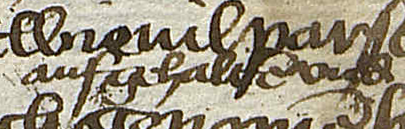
aufgehalte* vnd
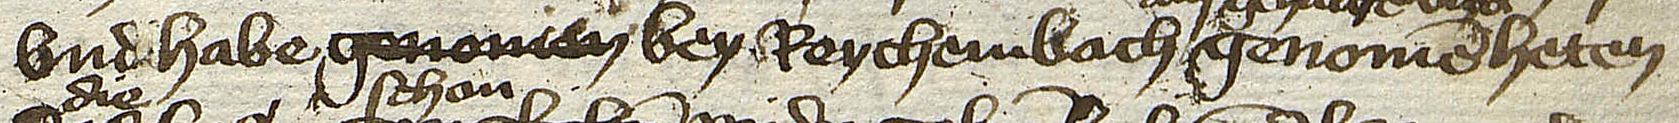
vnd habe genomen bey Reychenbach genome* heten
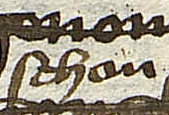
ſchon
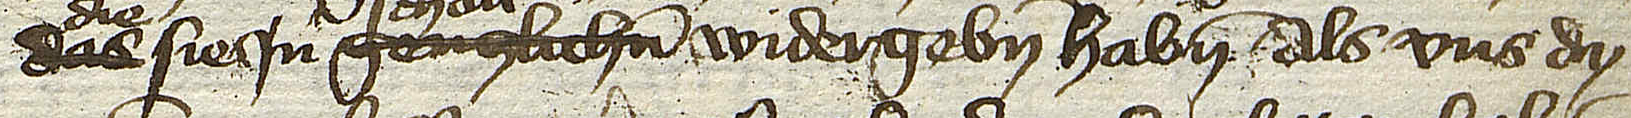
das ſie In gencʒlich*n widergeb*n hab*n Als vns dy
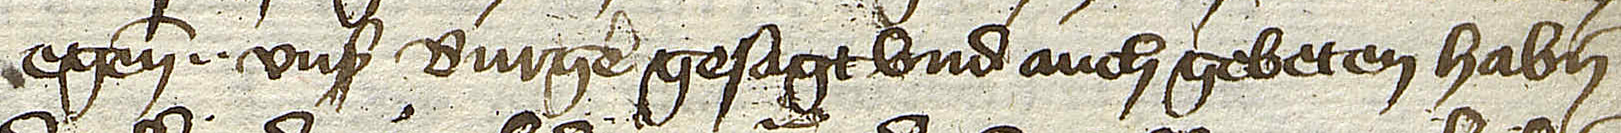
egen* ~ vnſ* Burge* geſagt vnd auch gebeten hab*n
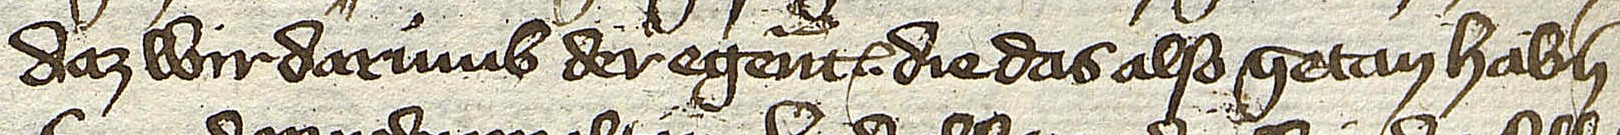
daʒ wir darümb der egen*t* ~ die das alſo getan hab*n
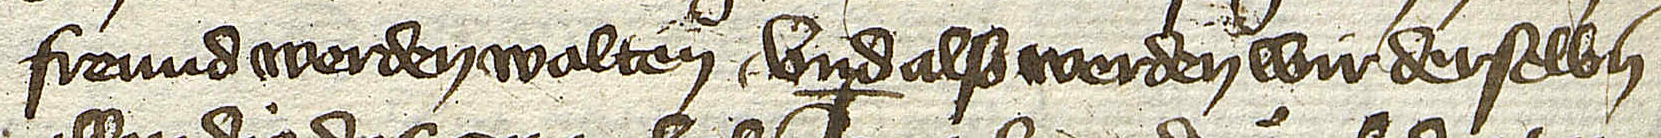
freund werden wolten / vnd alſo werden wir derſelb*n
